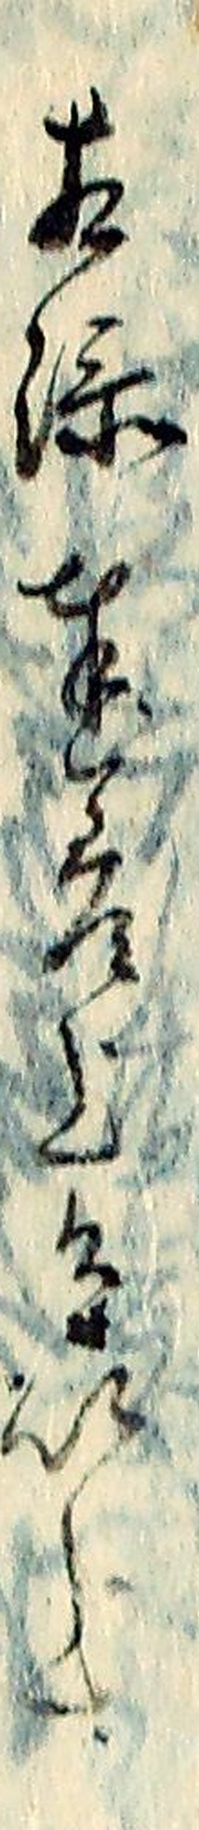相添奉差上候以上
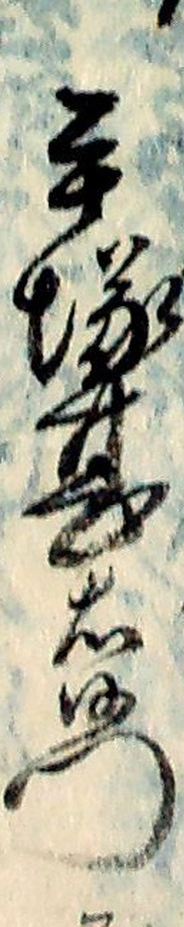手塚甚右衛門印
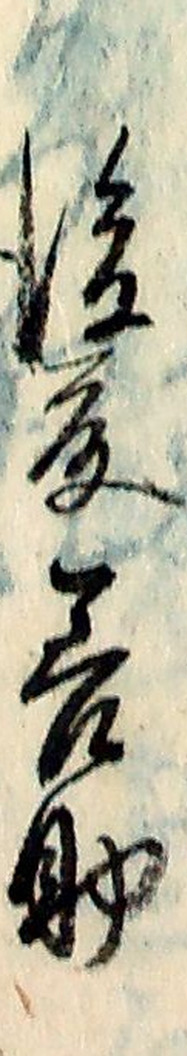後藤善助
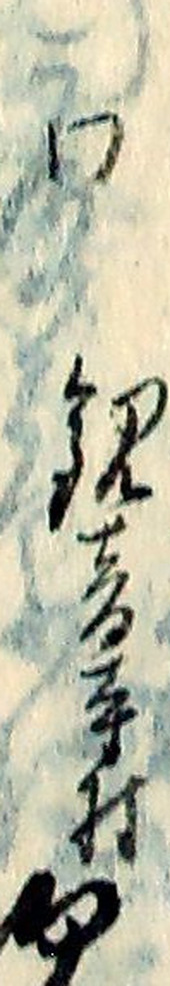同観音寺村
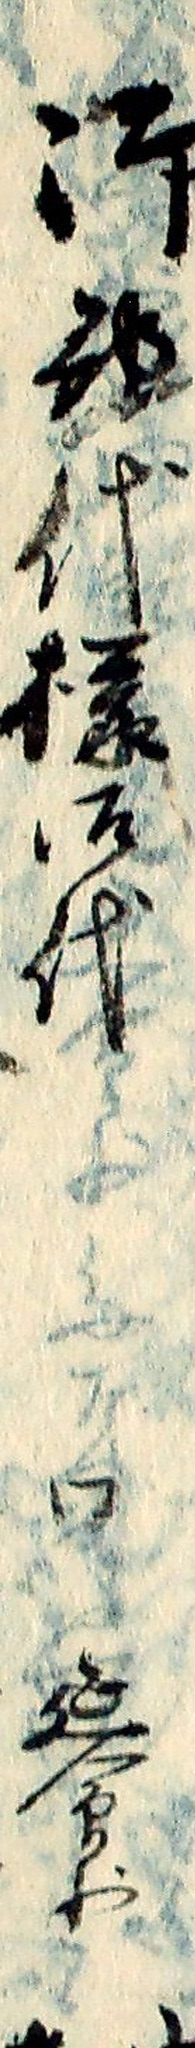御郡代様御代忠兵衛印
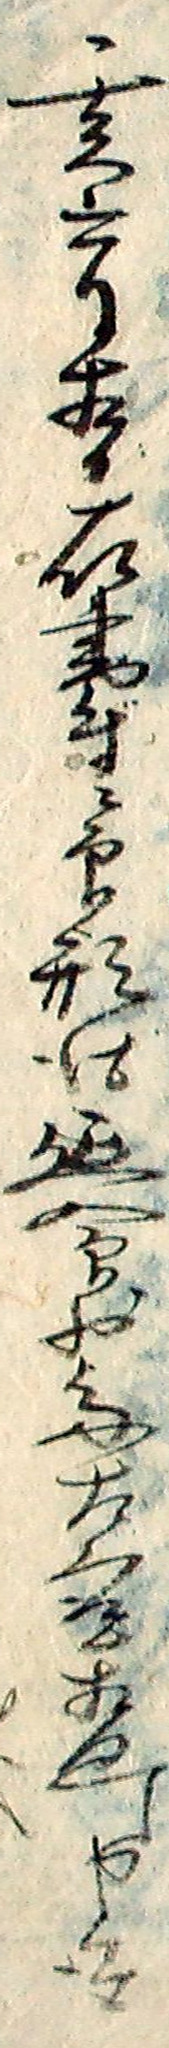亥六月廿日右書付に印形仕延命村多左衛門殿相廻し申候以上

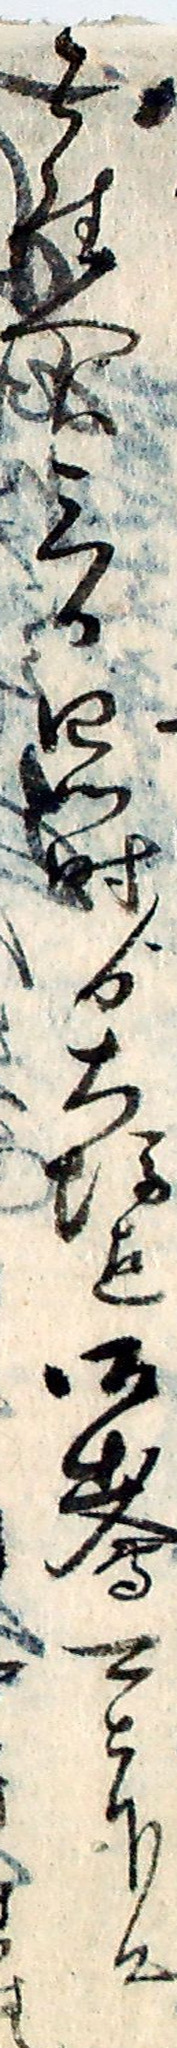御座候へは三日四つ時ゟ大場迄御出会可被下候
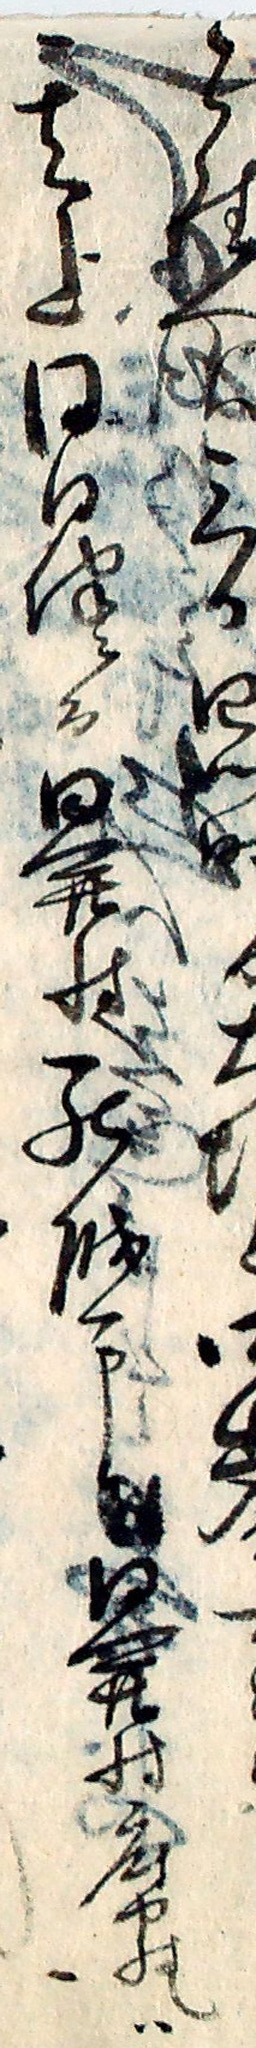其上同日伴にて日開村へ罷越可申候日開村府中村へは
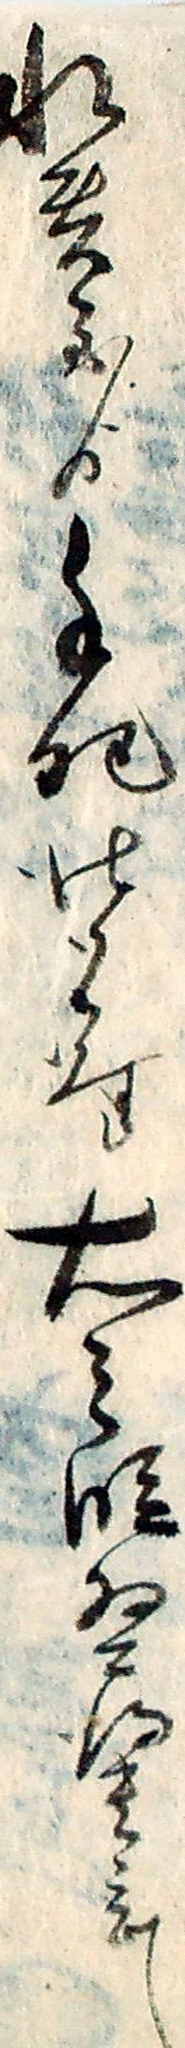私共にてゟ手配仕御座候右之段為可得貴意候
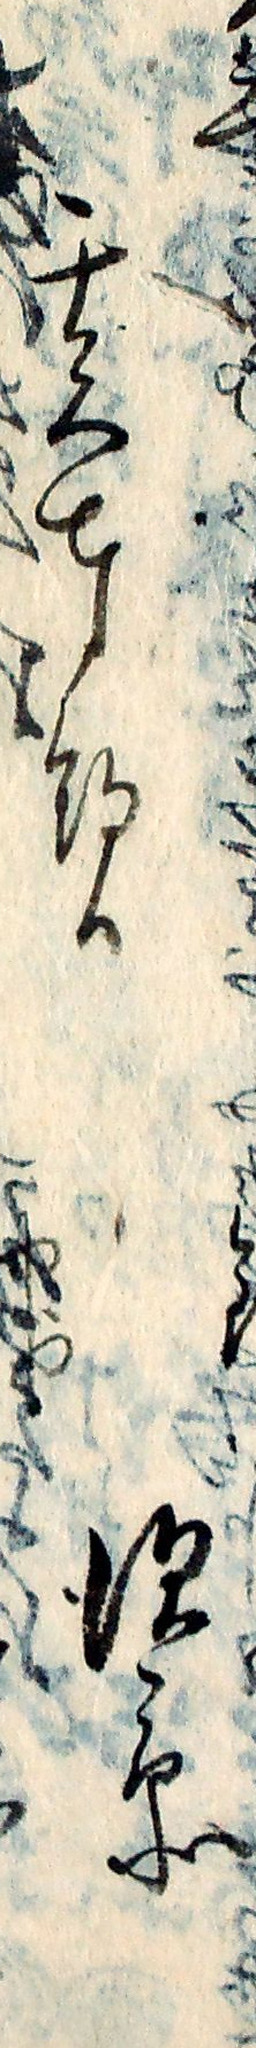亥七月朔日次兵衛
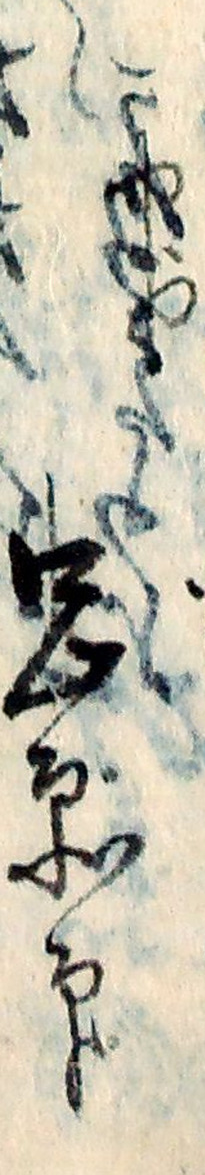忠兵衛印
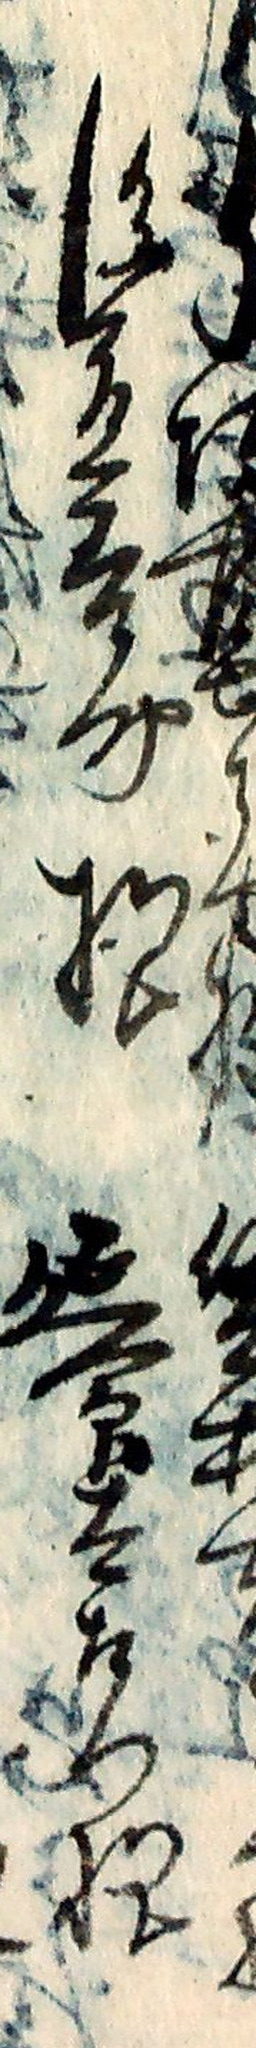後藤善助様延命吉左衛門様
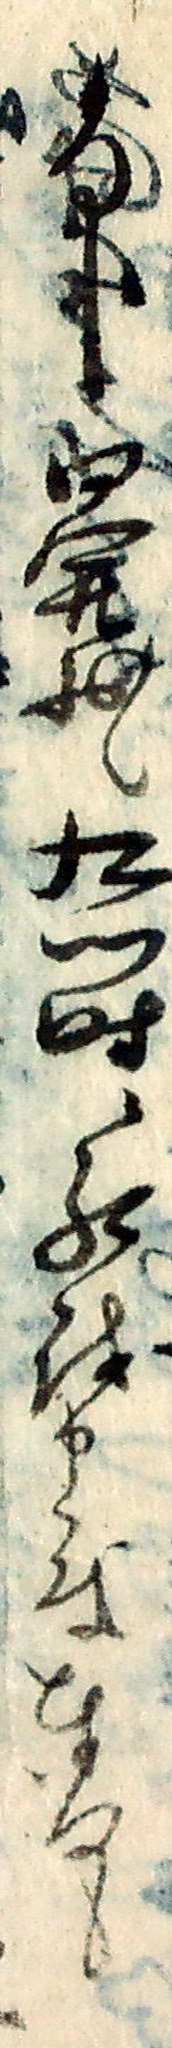尚々日開村へ九つ時に罷越申度奉存候
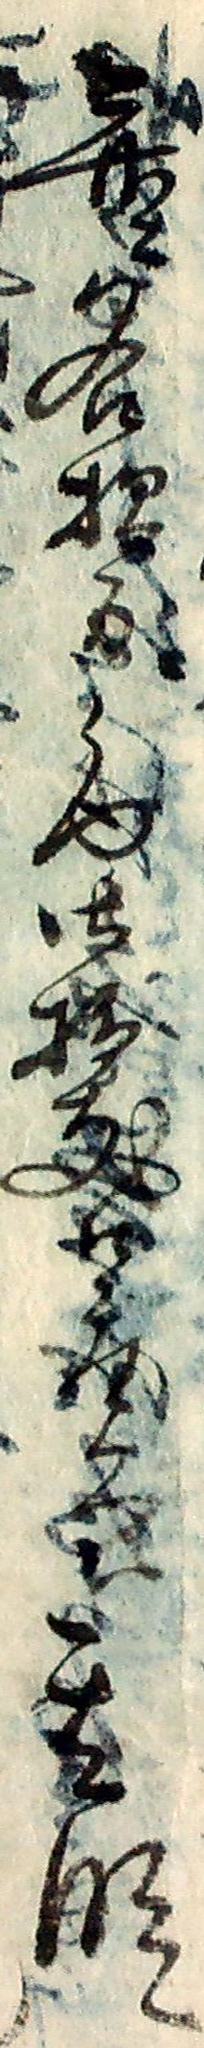并に各様方之内御指支御座候へは其段
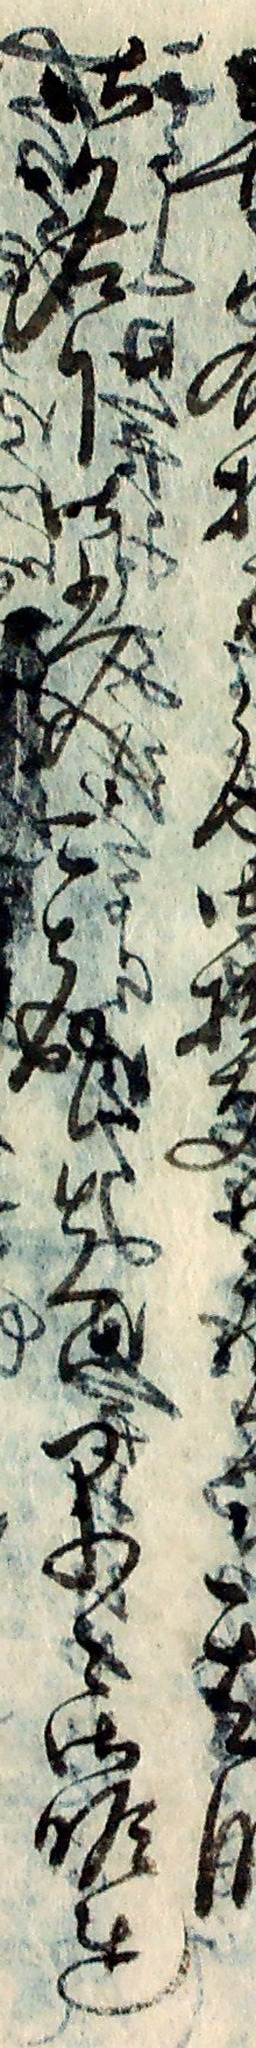御名下御書入可被成候先は早々御順達

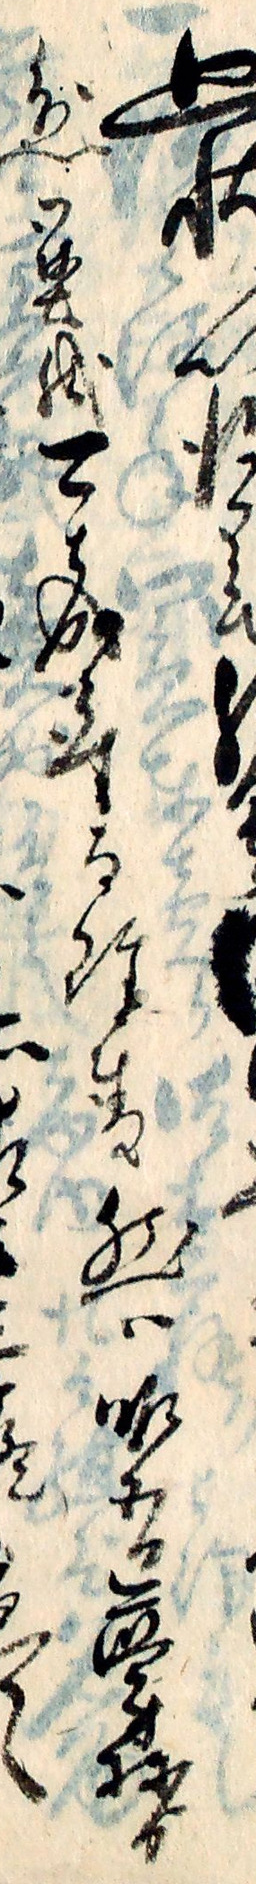愈御堅然可被成御座百珍奉存候然は昨五日藍方様ゟ
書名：諸御願書控(後藤氏壱番）
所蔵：鳴門教育大学 Naruto University of Education
